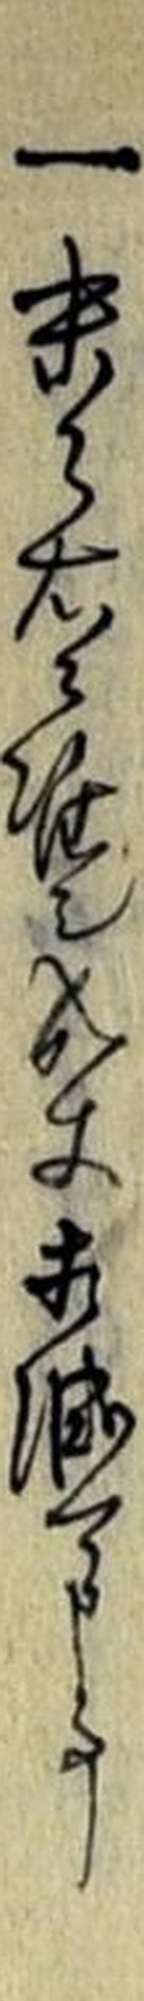一末々右ニ准シ成丈相減可申事
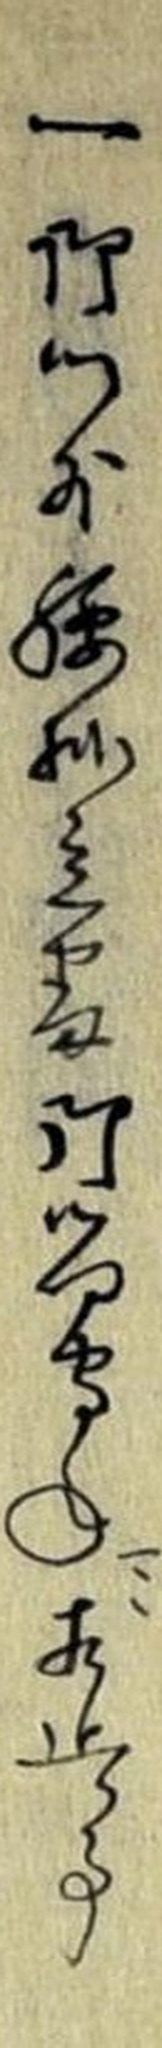一御門外腰掛立番御留守年相止候事
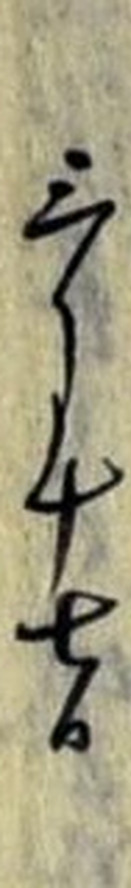三月十七日
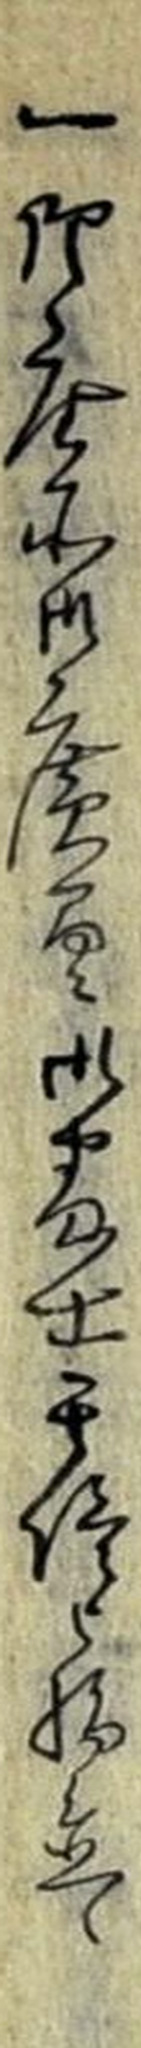一御座所御広間ニ御番士其儘被指置候
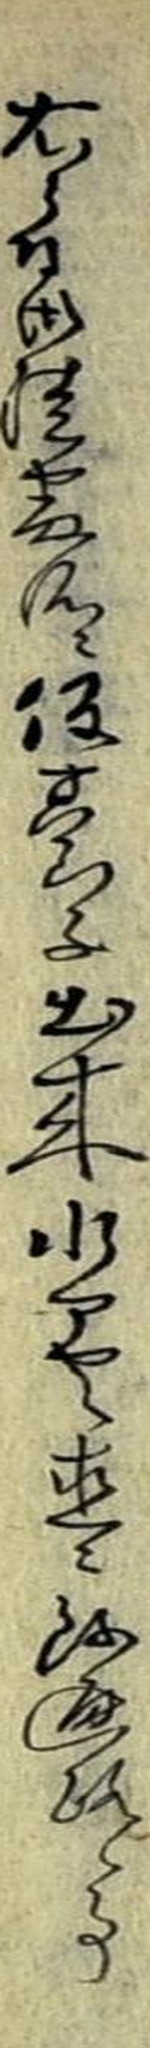右ニ付御徒番所ニ仮台子出来水部屋へ直ニ致通路候事
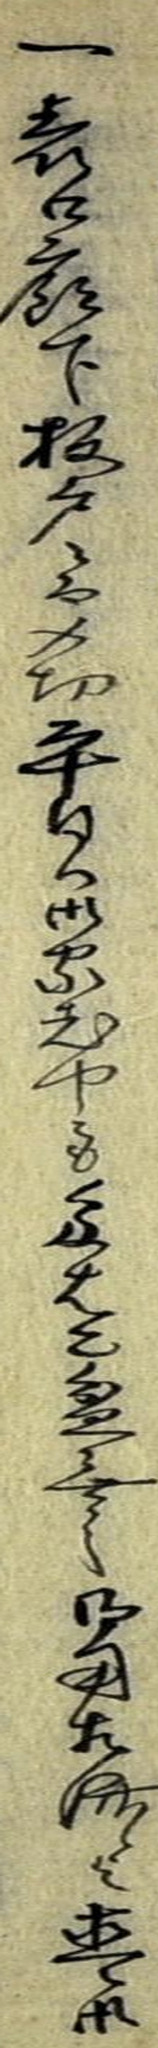一表口廊下板戸ニ而〆切平日ハ御家老中ニもたはこ盆無之御用相済候与直ニ御
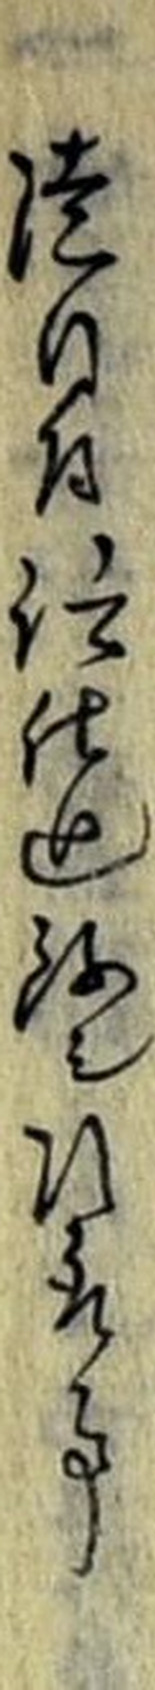徒目付跡仕廻致シ引取事
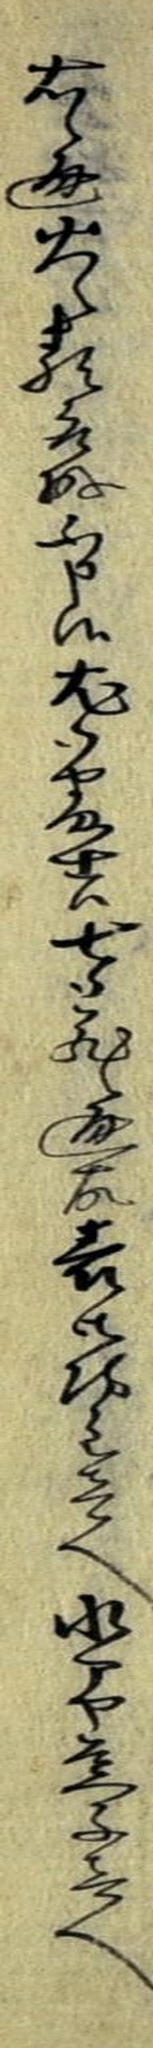右之通火之類取扱不申候尤御番士ハ七ツ蔵へ通故表御坊主壱人水部屋荒子壱人

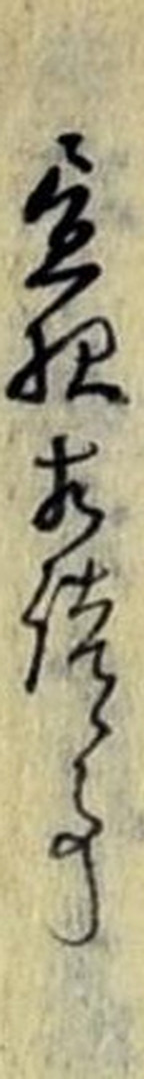昼夜相詰候事
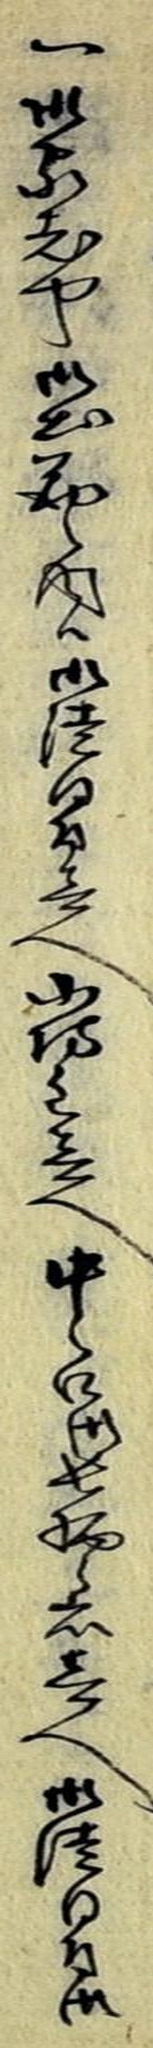一御家老中御出勤之内ハ御徒目付壱人小坊主壱人中之口御長柄之者壱人御徒目付御
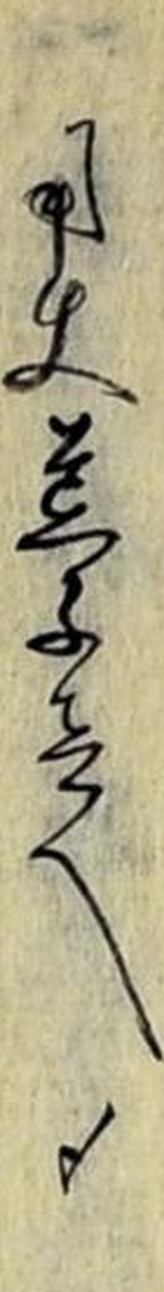用使荒子壱人〆
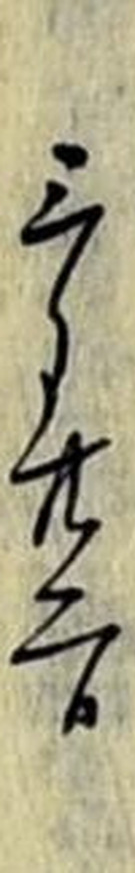三月廿二日
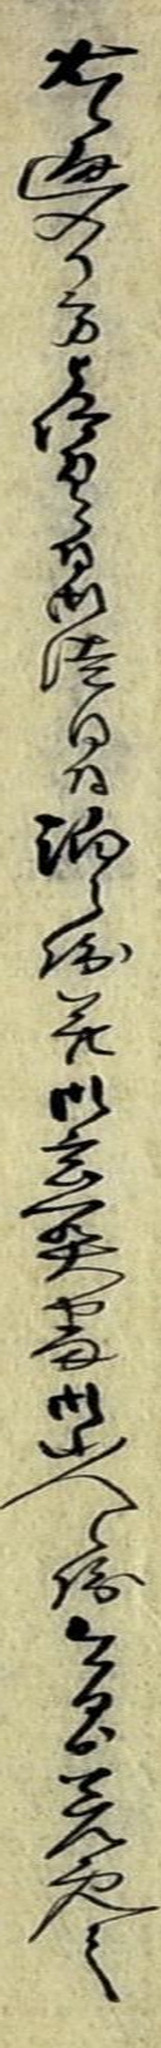右之通〆り方被仰付候ニ付御徒目付泊之儀并御玄関番御小人之儀今日ゟ差免之
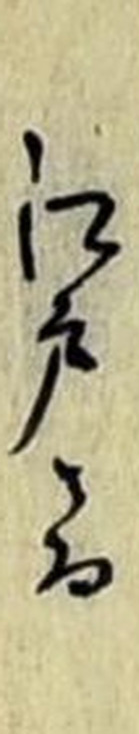江戸ニ而
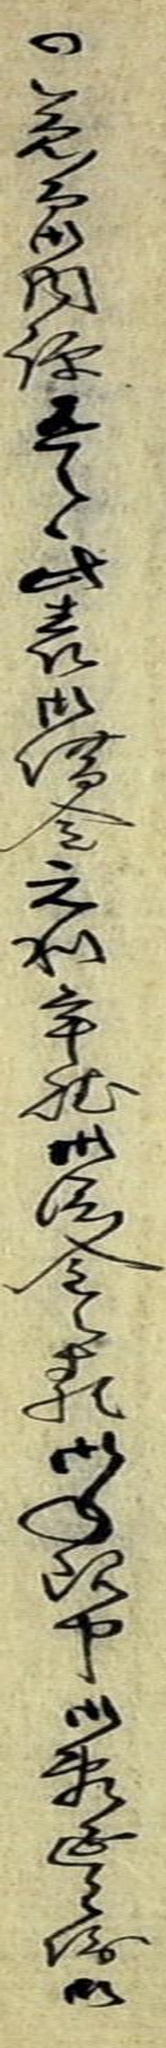〇兼而御内許有之候此表御借金元利年賦御渡金之類御年限中御頼延之儀御
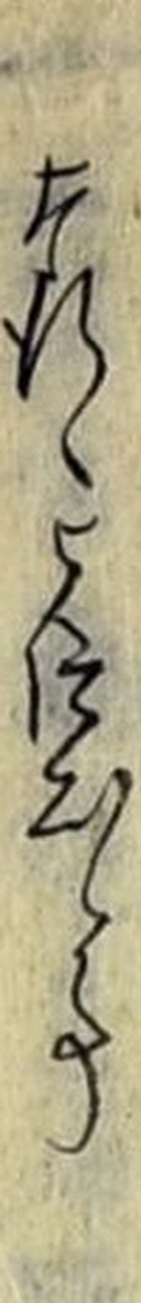奉行へ被仰出候事
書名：命令之部 三
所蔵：福井県文書館 Fukui Prefectural Archives
